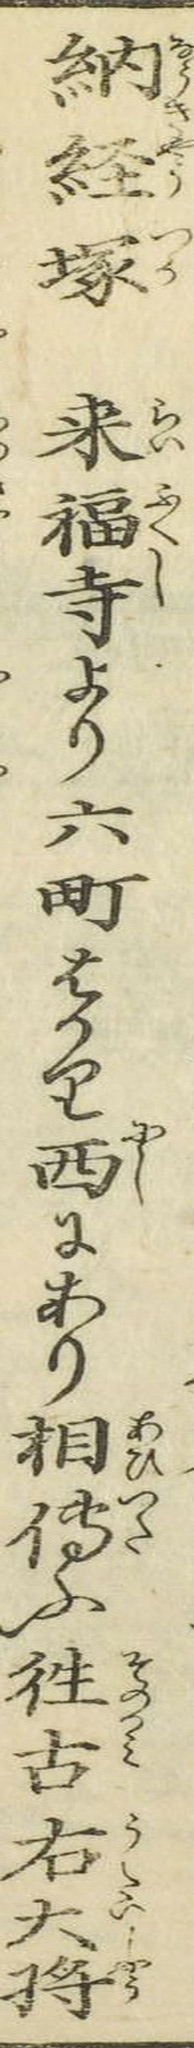納経塚来福寺より六町はかり西にあり相傳ふ往古右大将
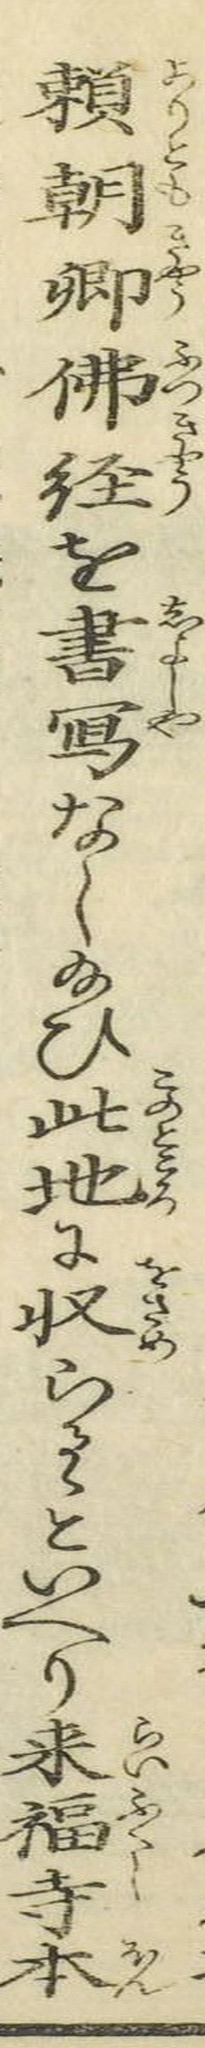頼朝卿佛経を書冩なし給ひ此地に収らるゝといへり来福寺本
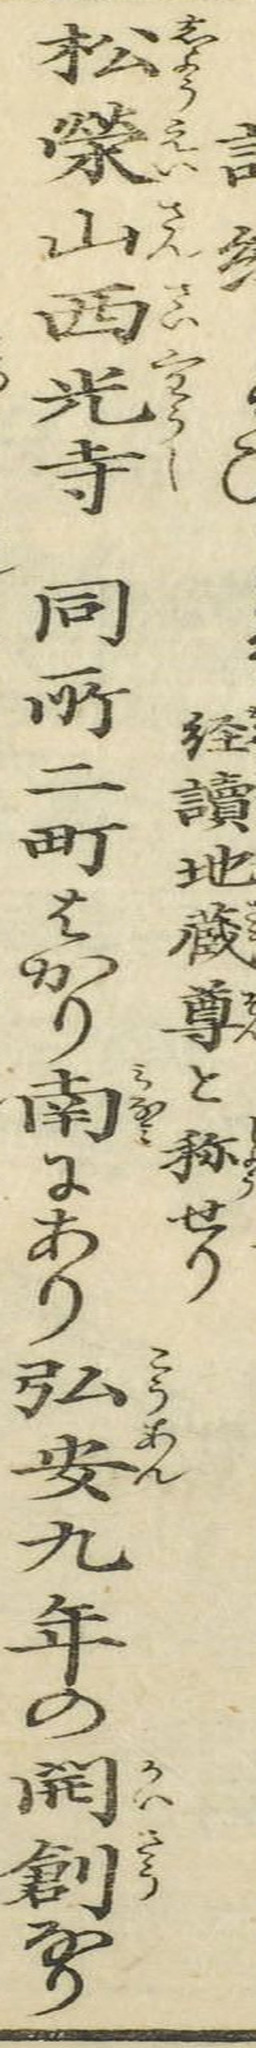松榮山西光寺同所二町はかり南にあり弘安九年の開創なり
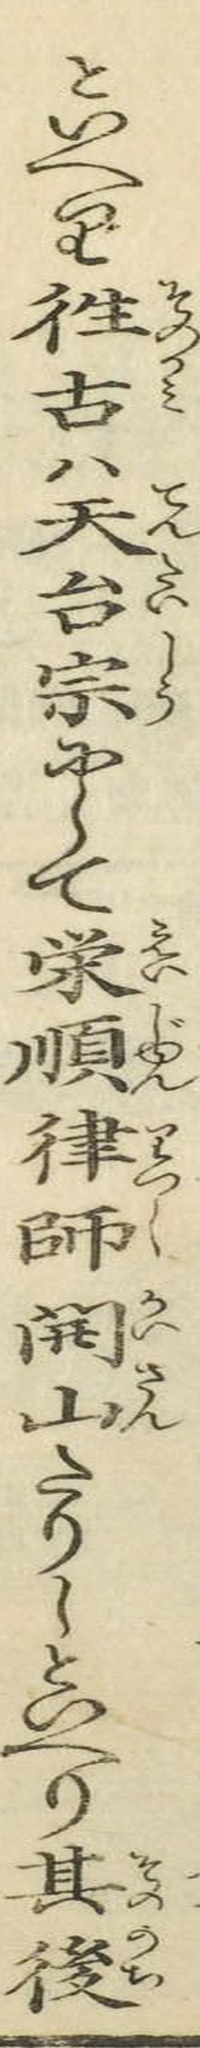といへり往古は天台宗にして栄順律師開山たりしといへり其後
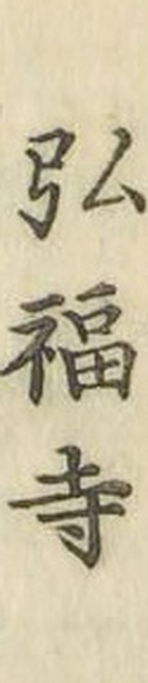弘福寺

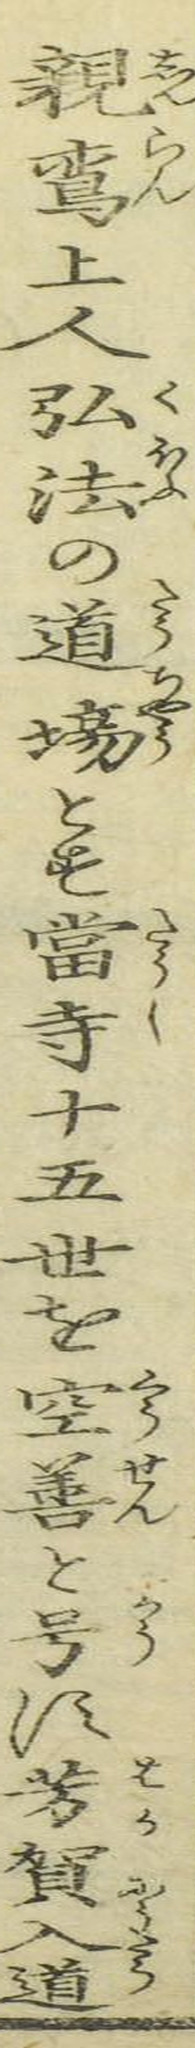親鸞上人弘法の道塲とす當寺十五世を空善と号す芳賀入道
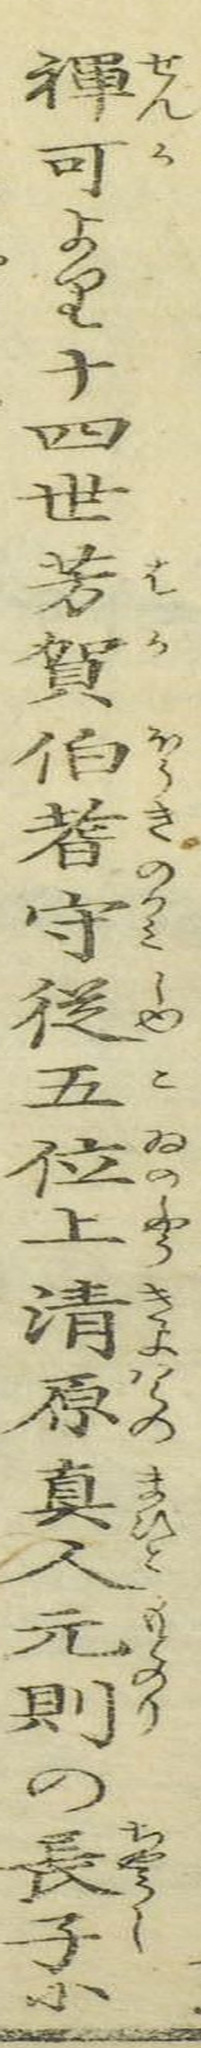禪可より十四世芳賀伯耆守従五位上清原真人元則の長子に
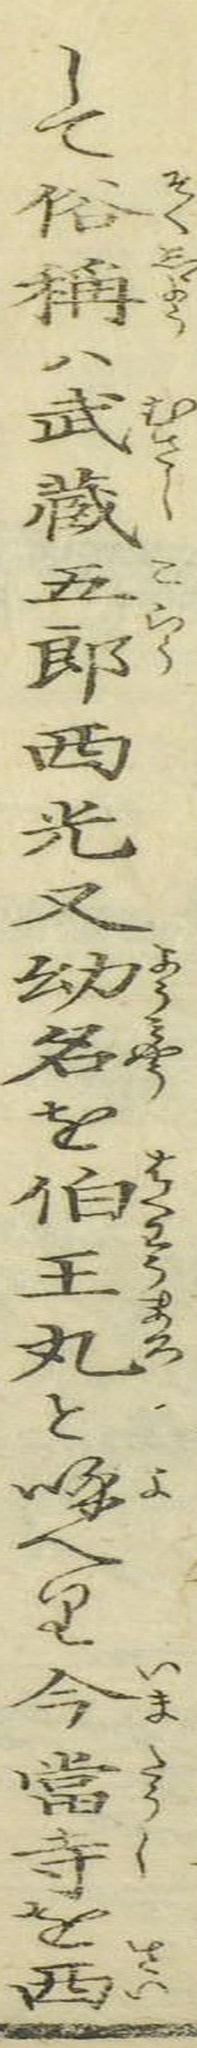して俗稱は武蔵五郎西光又幼名を伯王丸と呼へり今當寺を西
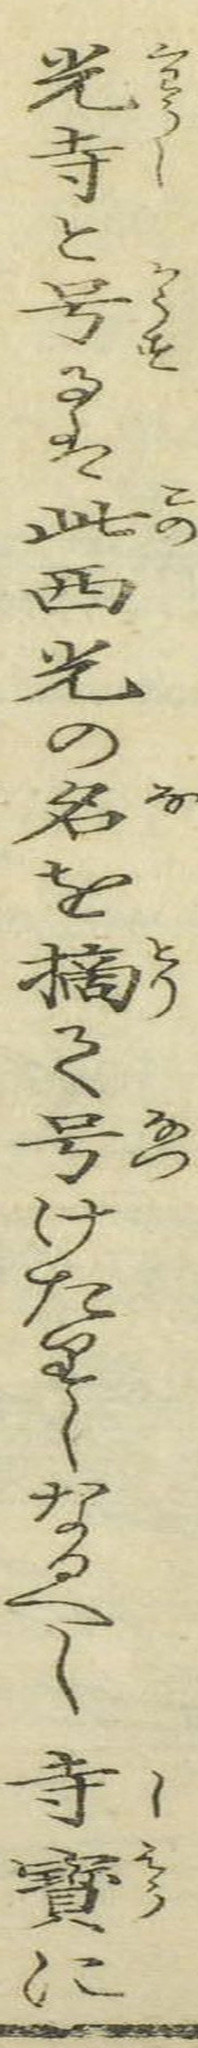光寺と号るは此西光の名を摘て号けたりしなるへし寺寳に
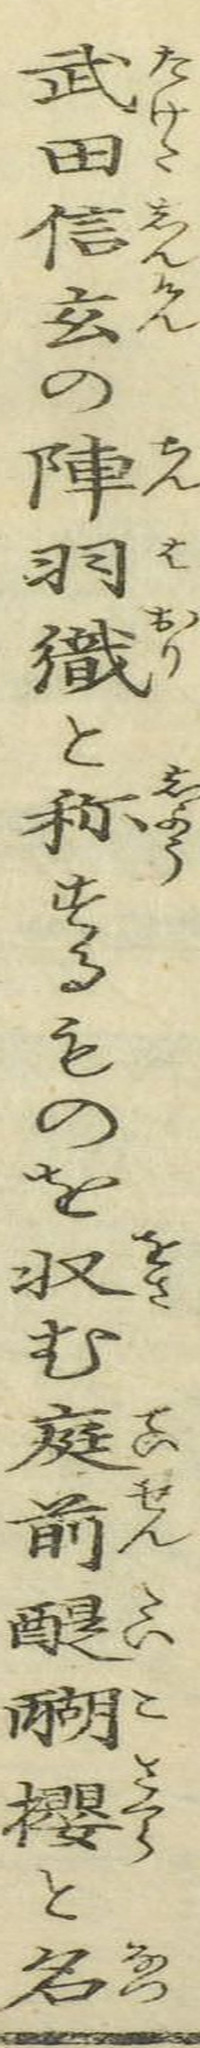武田信玄の陣羽織と称するものを収む庭前醍醐櫻と名
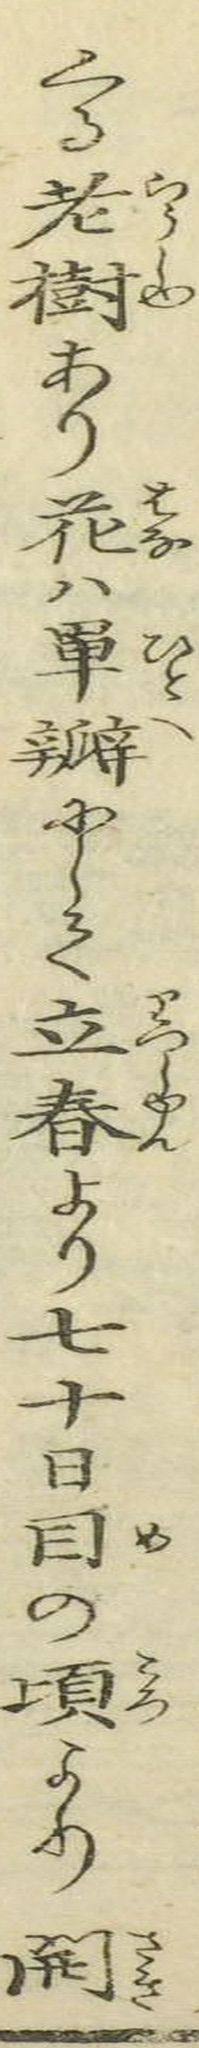くる老樹あり花は單瓣にして立春より七十日目の頃より開
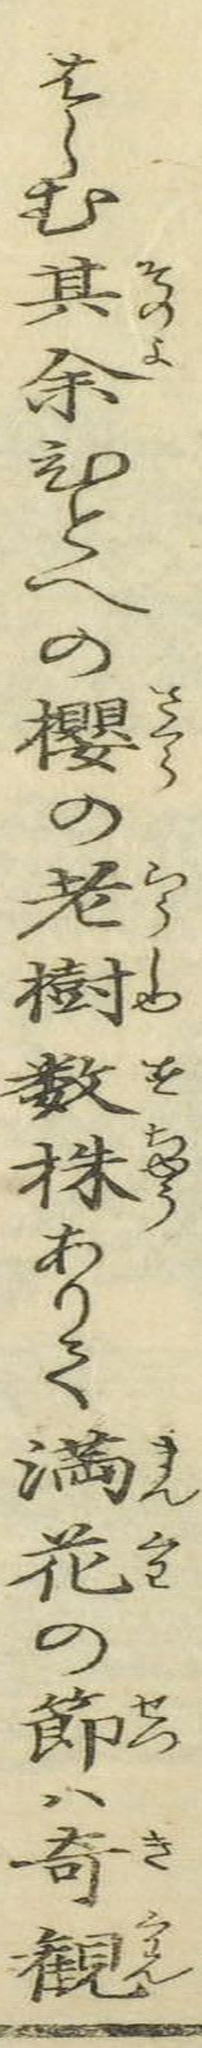はしむ其余ひとへの櫻の老樹数株ありて満花の節は奇観
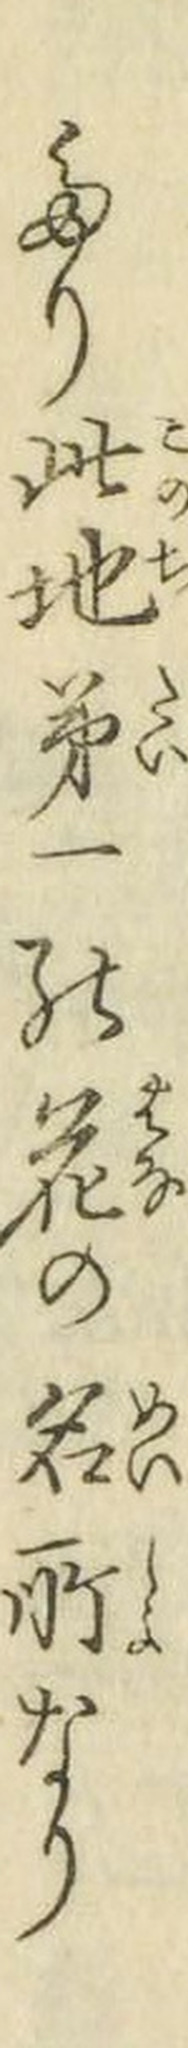たり此地第一の花の名所なり
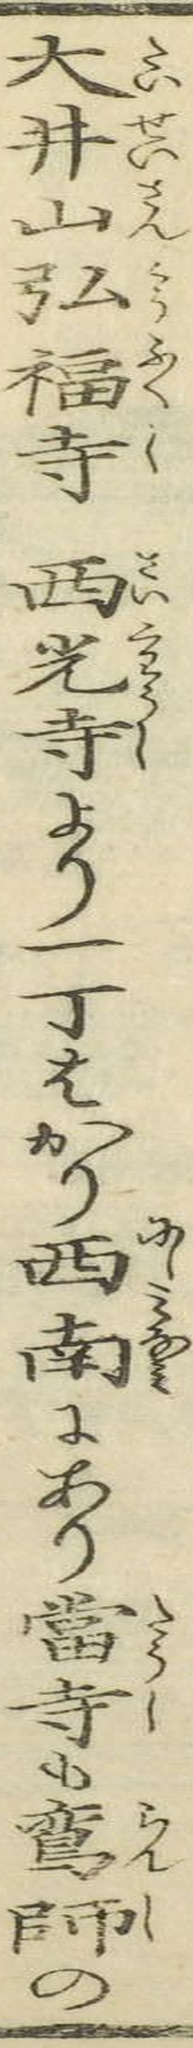大井山弘福寺西光寺より一丁はかり西南にあり當寺も鵉師の
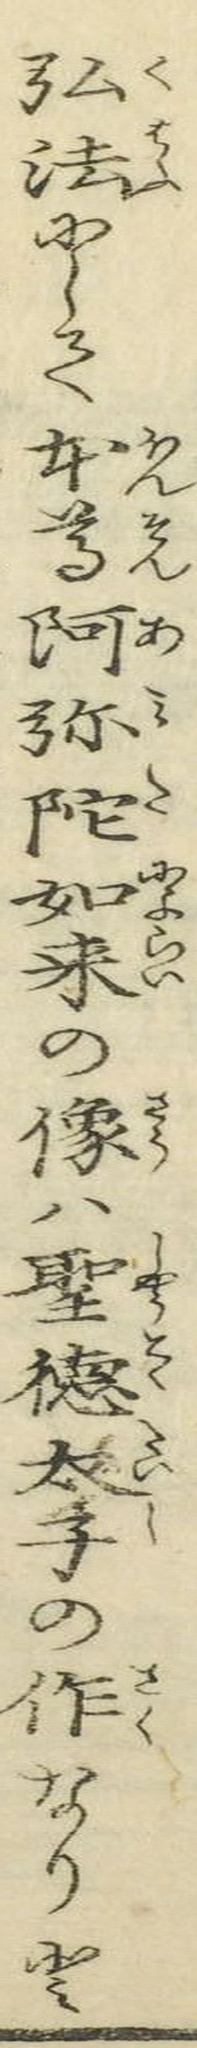弘法にして本尊阿弥陀如来の像は聖徳太子の作なりと
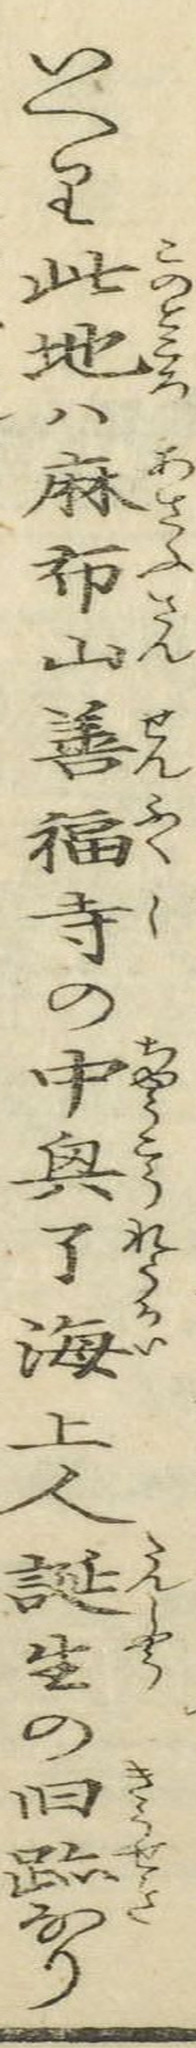いへり此地は麻布山善福寺の中興了海上人誕生の旧跡なり
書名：江戸名所図会 20巻 巻之4
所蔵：東京学芸大学教育コンテンツアーカイブ
